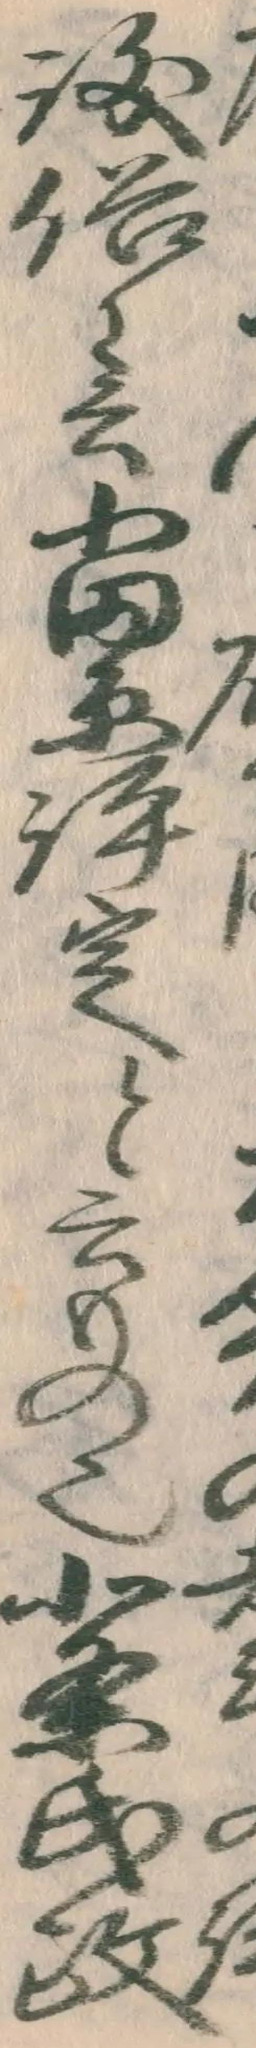議俗に云小田原評定と云もの也北条氏政
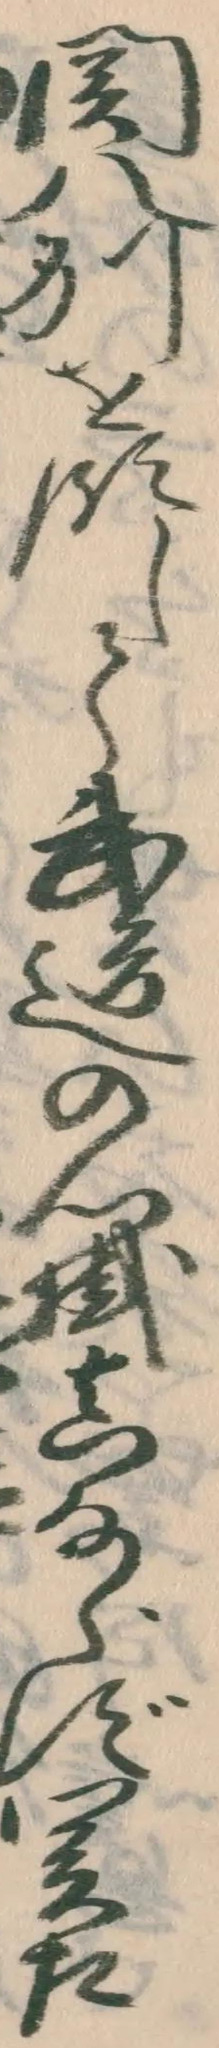関八州を領して武道の心掛真ならず関左
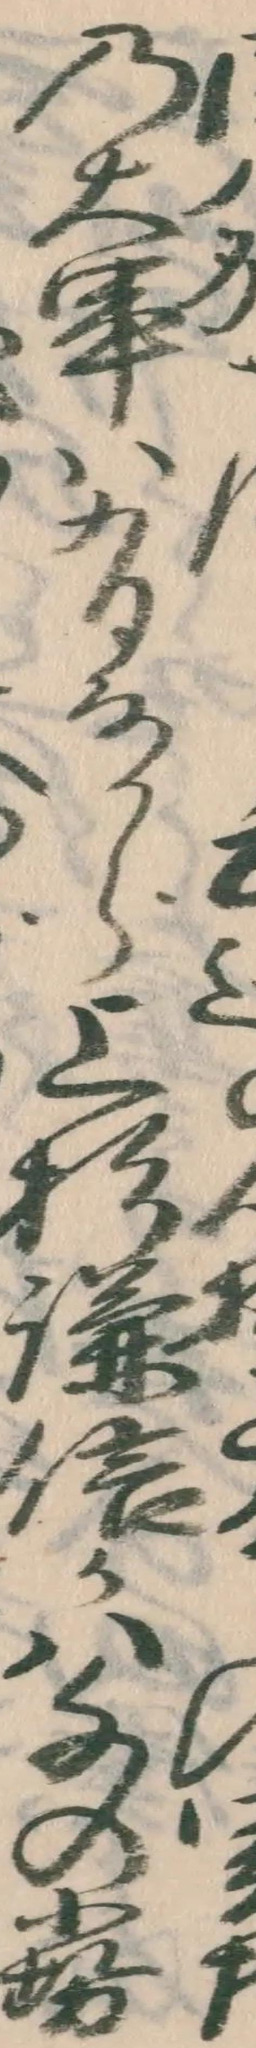の大軍ハ有なから上杉謙信か八千の小勢
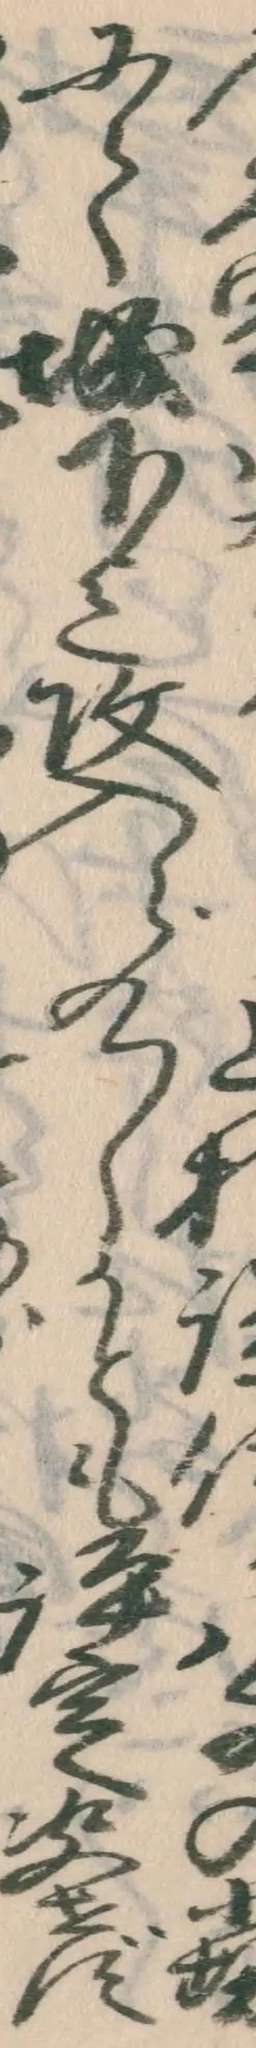にて城下迄攻入られしかとも評定決せず
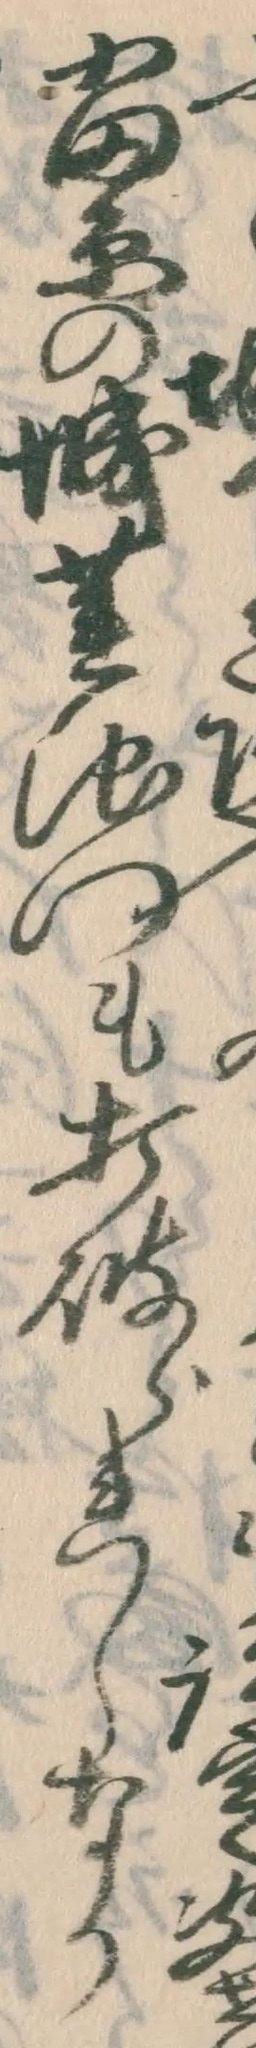小田原の城蓮池門も打破られしなり
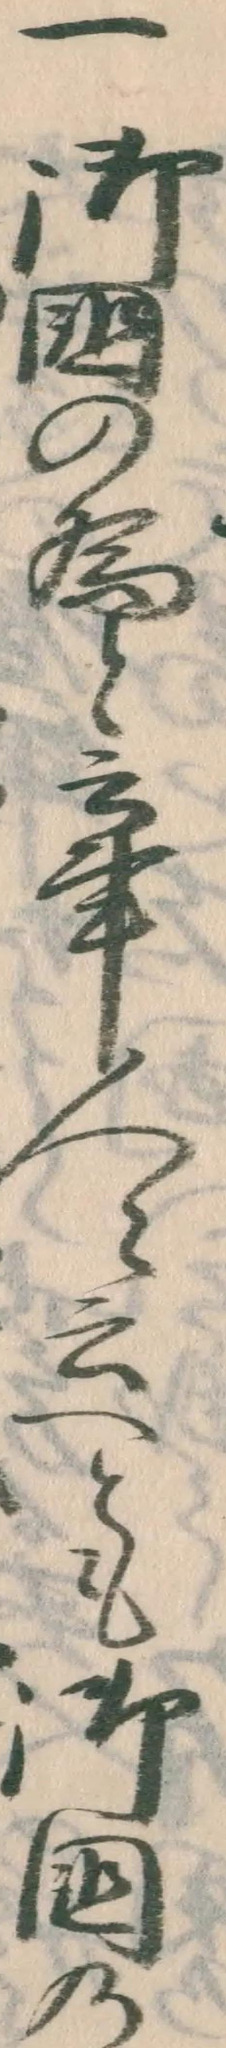一御国の為と云事人々云へとも御国の
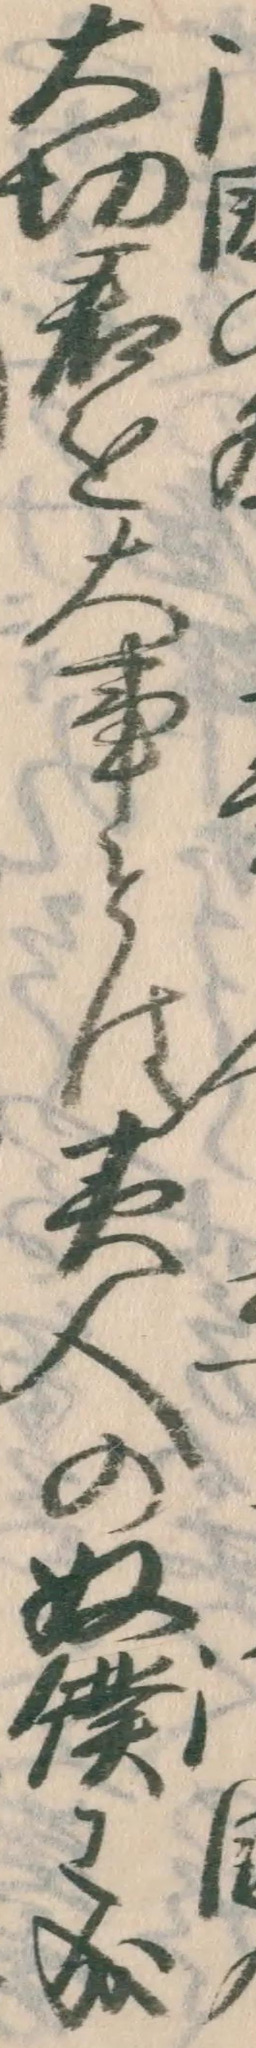大切君を大事とは夷人の奴僕に成
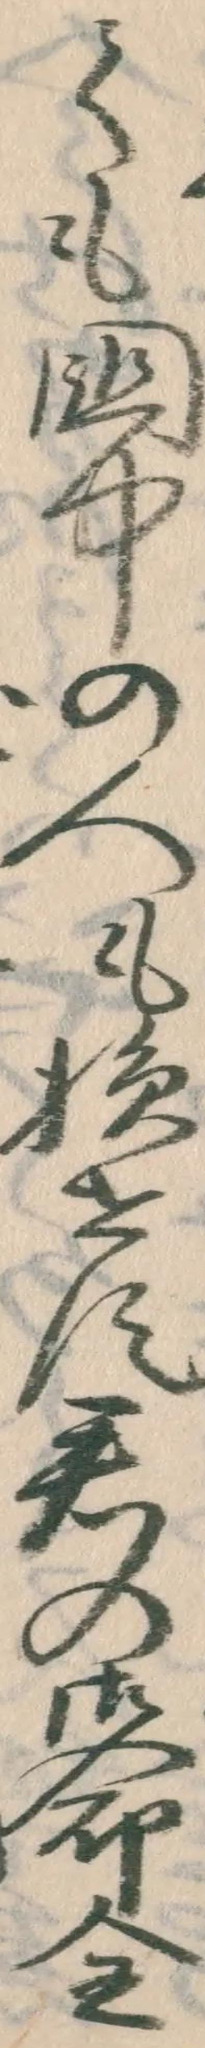ても国中の人も損せす君の御命全
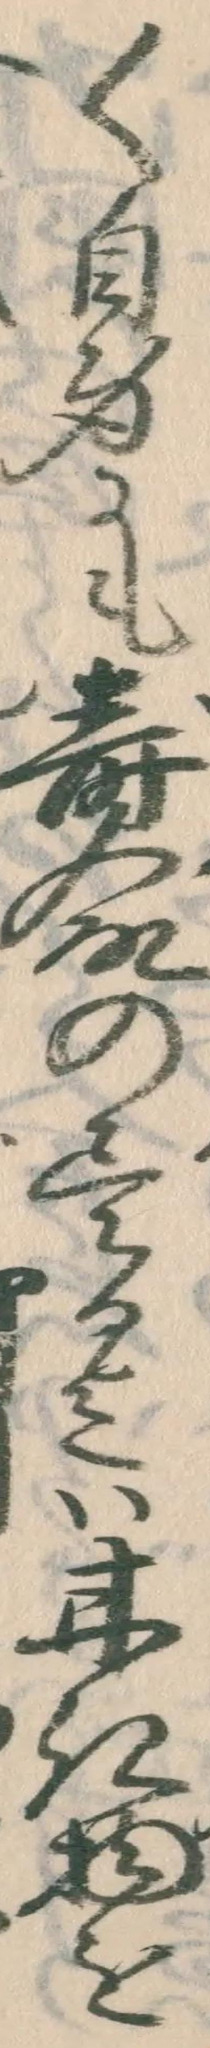く自身にも壽命の盡る迄ハ甘き物を
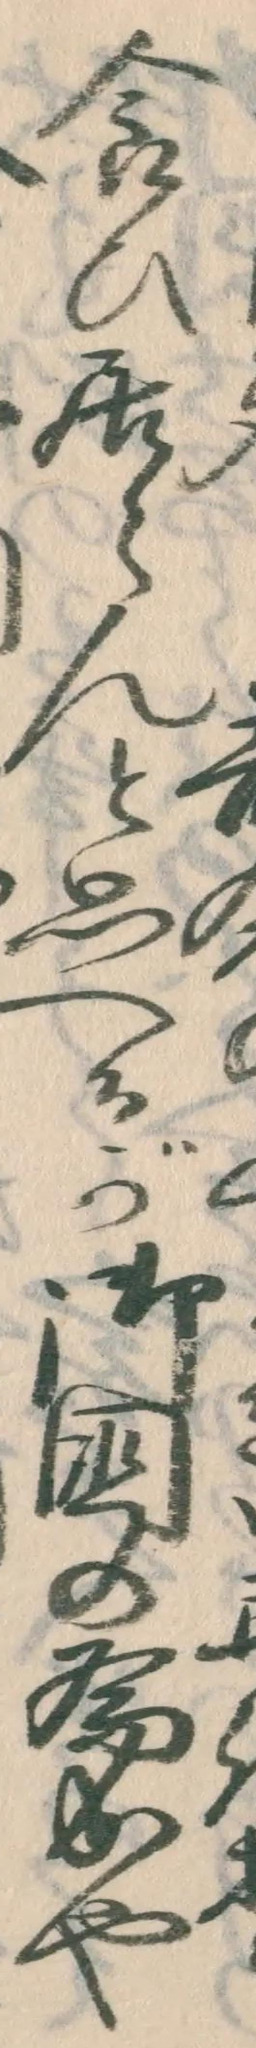食ひ居らんと思へるが御国の為成や
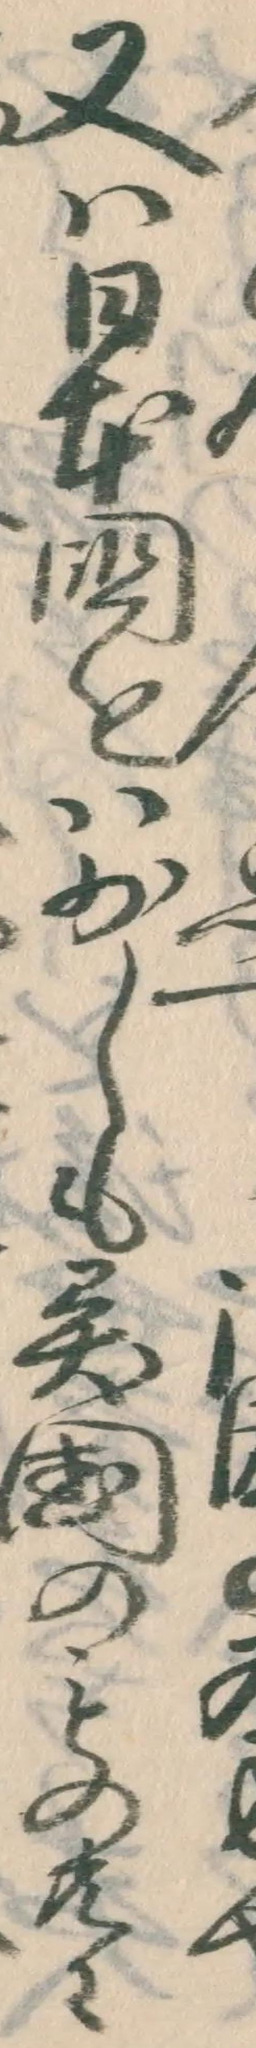又ハ日本国をハ少しも異国のもの共に
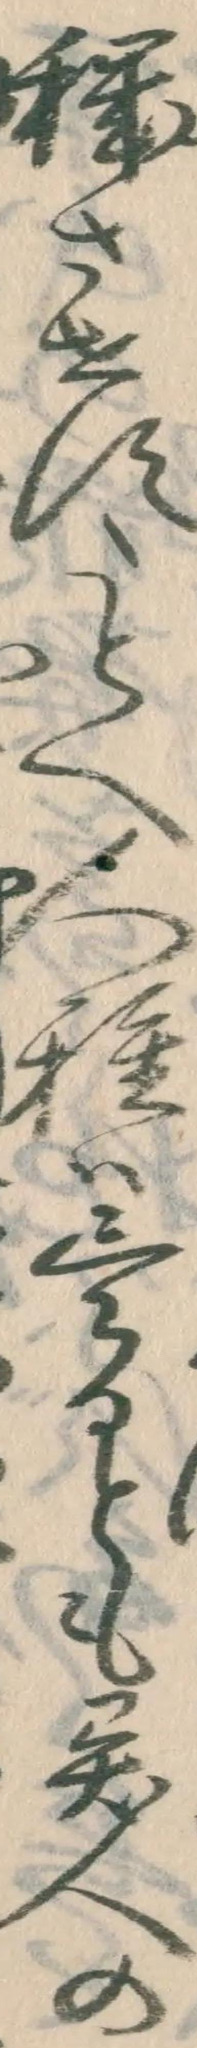穢させすたとへ人種ハ盡るとも異人の
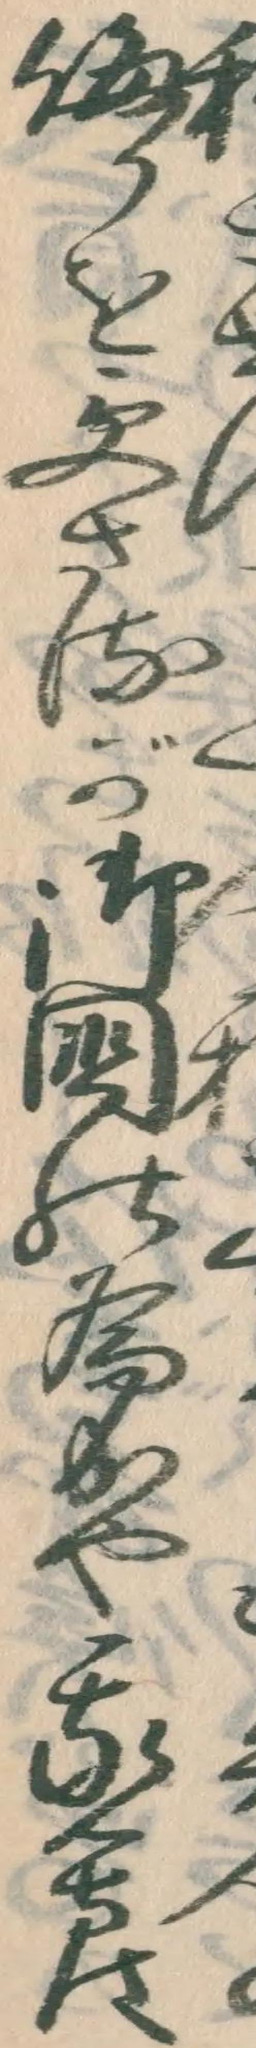侮りを受さるが御国の為成や我等は

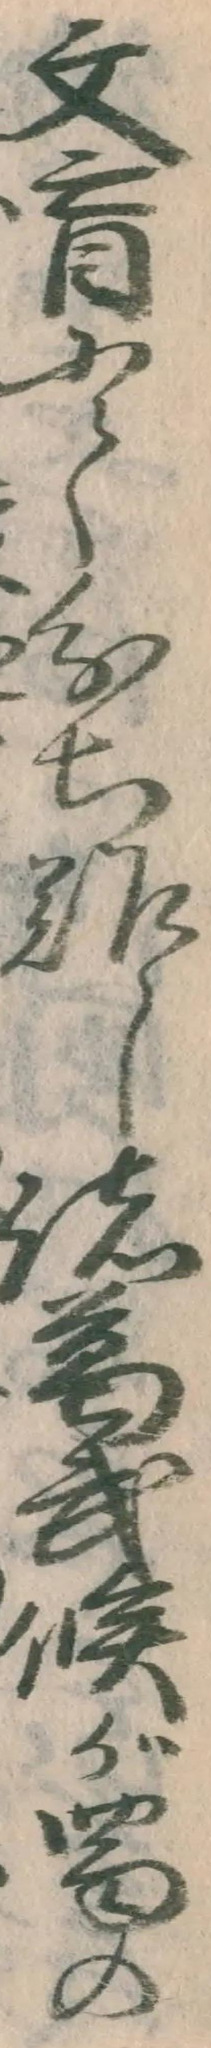文盲にて分ち難し諸葛武侯が蜀の
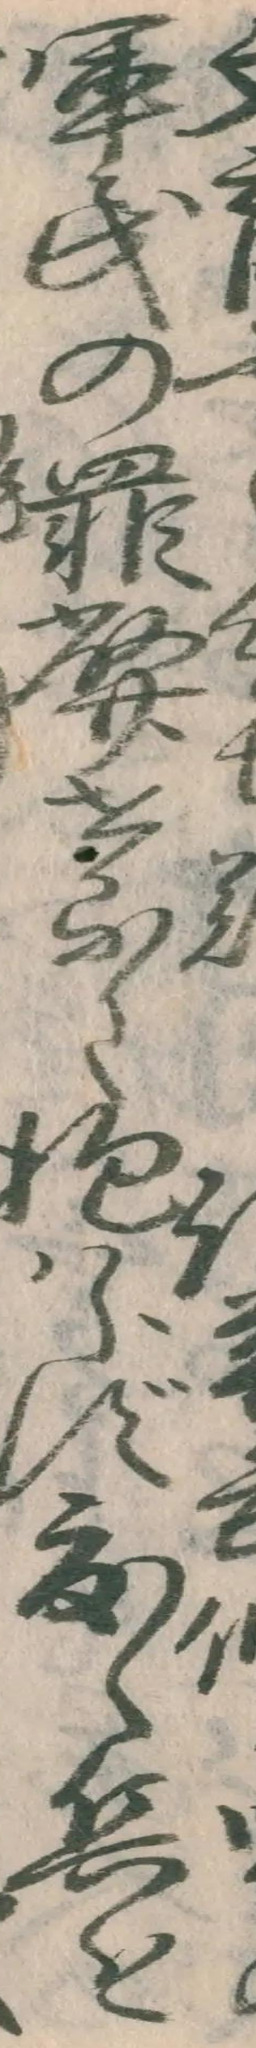軍民の罪弊せるに拘ハらず度ゝ兵を
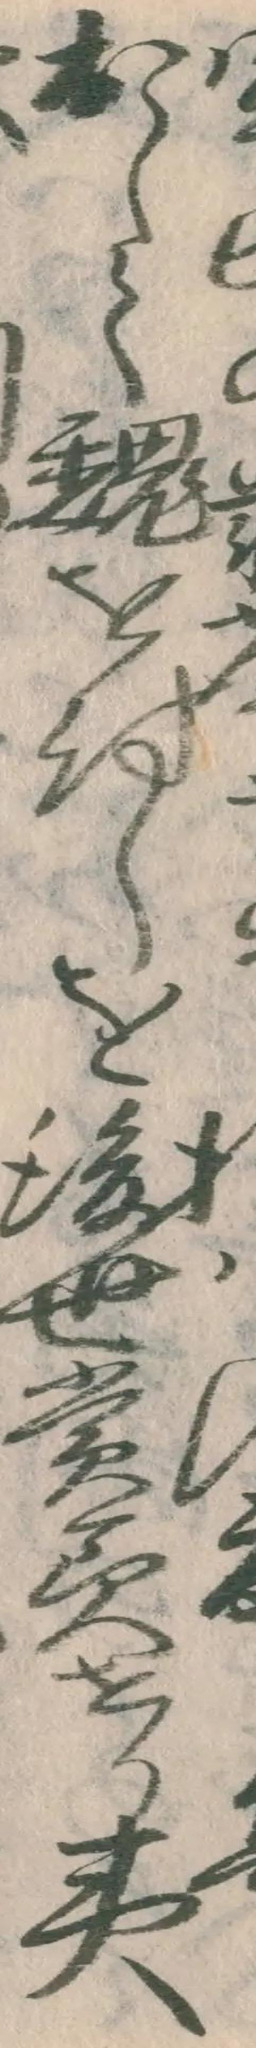出して魏を討しを後世賞美せり夷
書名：麗斎叢書. 20
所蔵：国立国会図書館 National Diet Library, JAPAN
